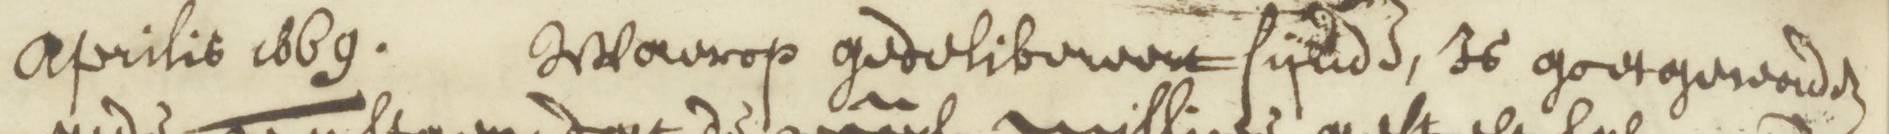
Aprilis 1669. Waerop gedelibeert sijnde, Is goetgevonden
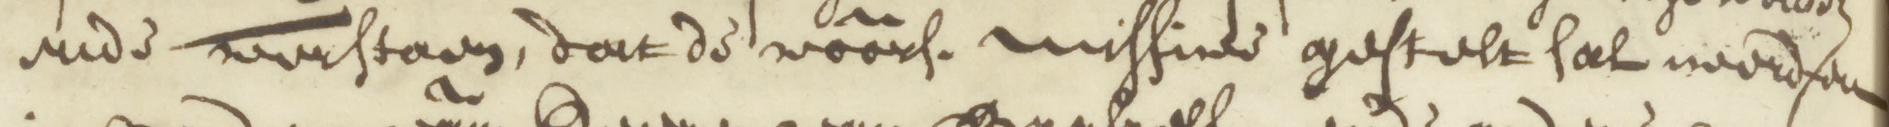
ende verstaen, dat de voors. missive gestelt sal werden
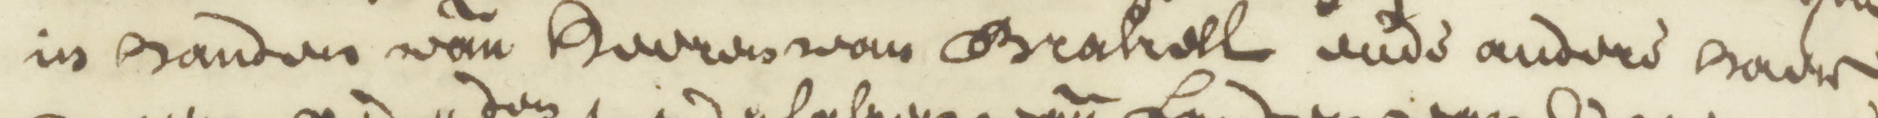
in handen van Heeren van Brakell ende andere haer
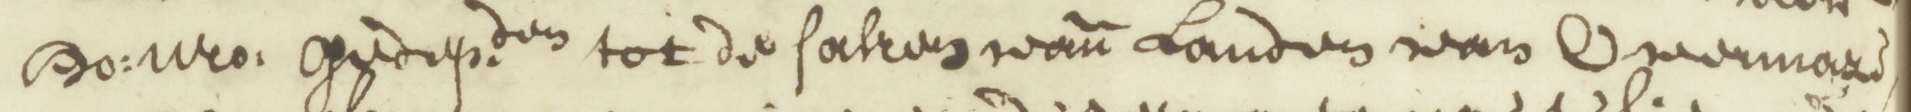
Ho:Mo: gedep.den tot de saken van Landen van Overmaze
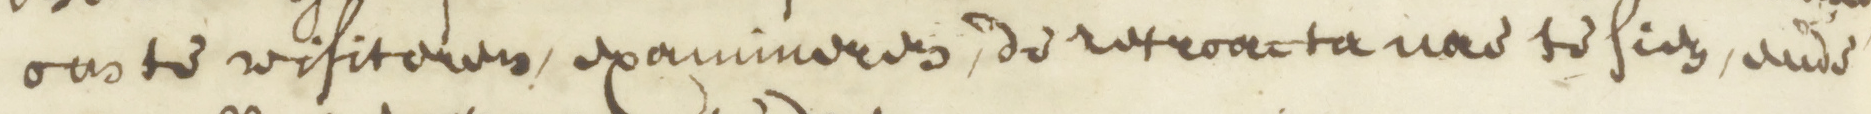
om te visiteren, examineren, de retroacta nae te sien, ende
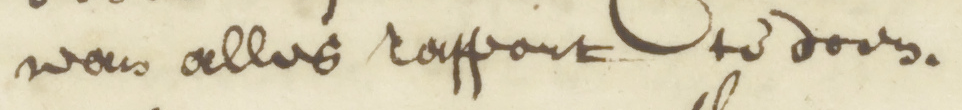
van alles rapport te doen.
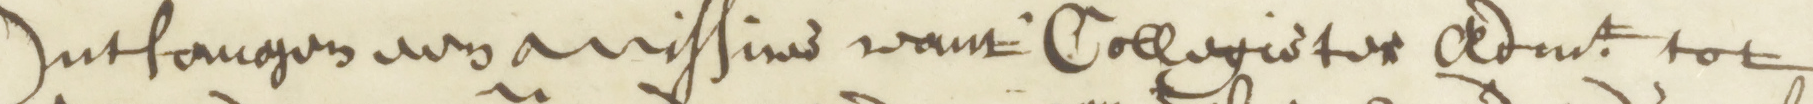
Ontfangen een missive vant' Collegie ter Admt tot
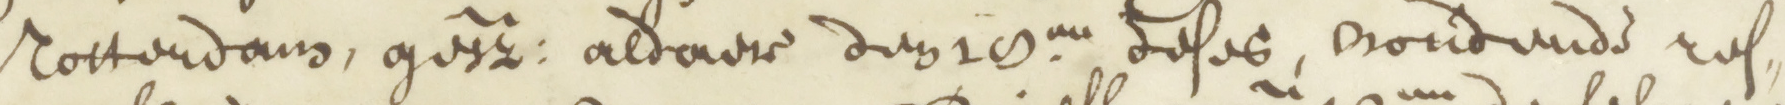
rotterdam, gesr. aldaer den 18en deses, houdende res„
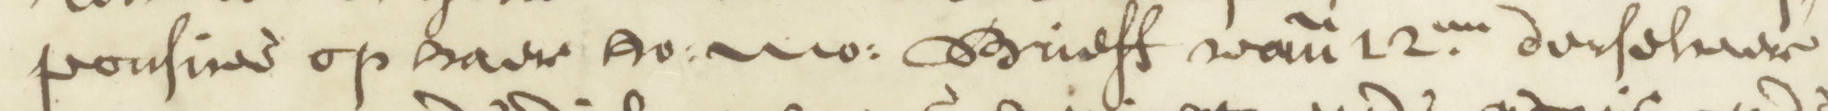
ponsive op haer Ho:Mo: Brieff van 12en derselver
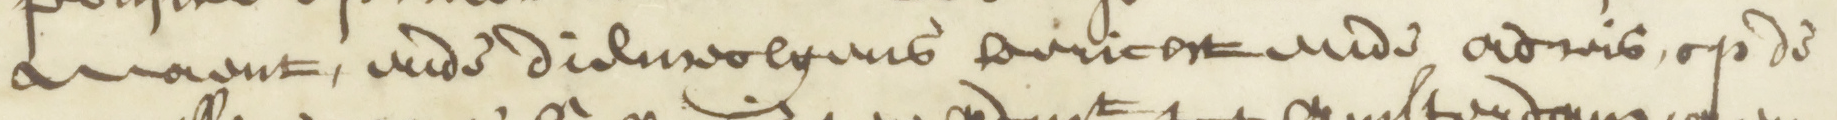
maent, ende dienvolgens bericht ende advis op de
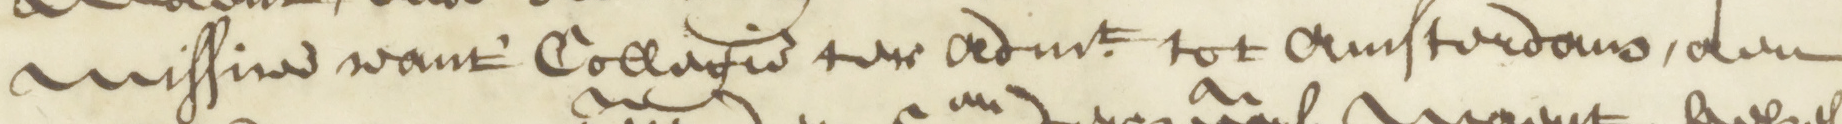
missive vant' Collegie ter Admt tot Amsterdam, aen
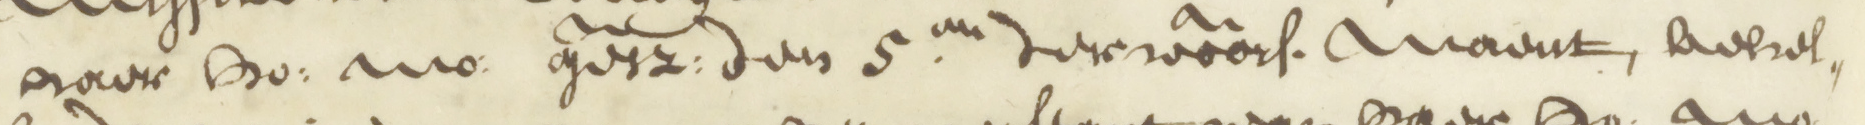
haer Ho:Mo: gesr: den 5en der voors. maent, betref„
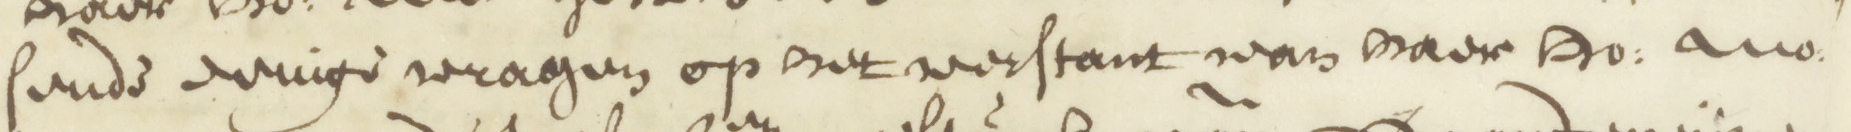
fende eenige vragen op het verstant van Haer Ho:Mo:
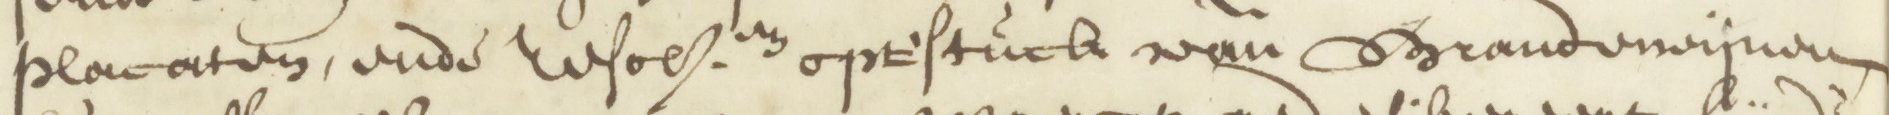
placaten, ende resol.en opt' stuck van Brandewijnen
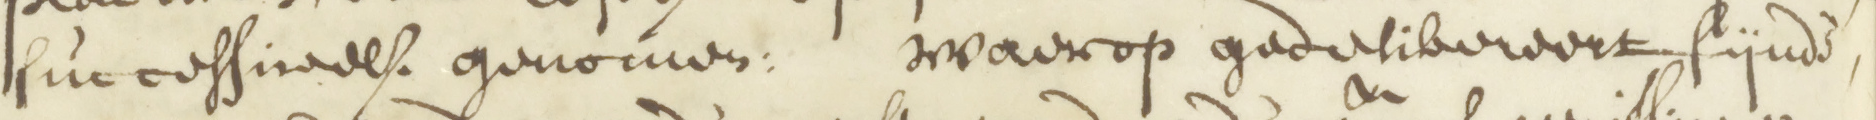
successivel. genomen. Waerop gedelibereert sijnde,
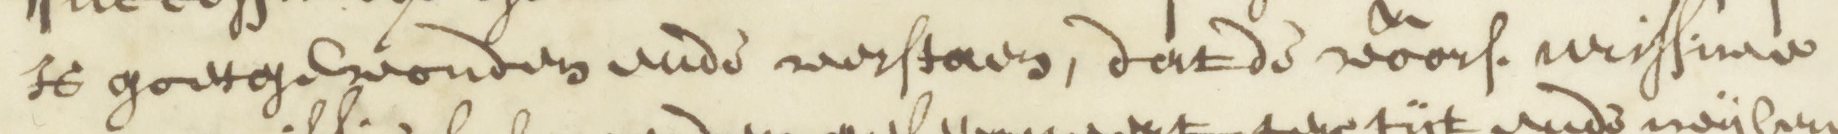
Is goetgevonden ende verstaen, dat de voors. missive
